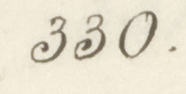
330.
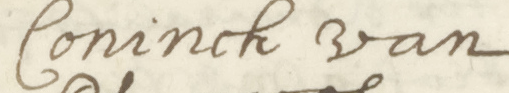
Coninck van
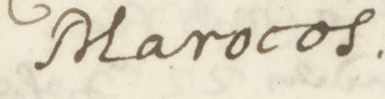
Marocos.
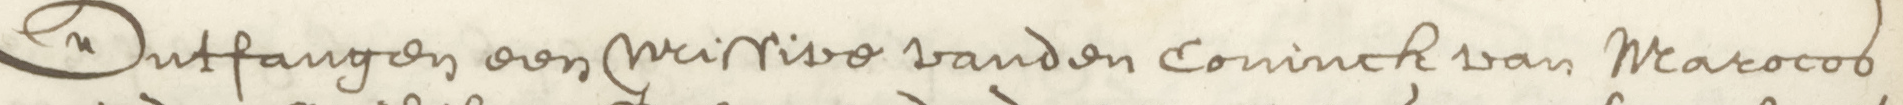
Ontfangen een missive vanden Coninck van Marocos
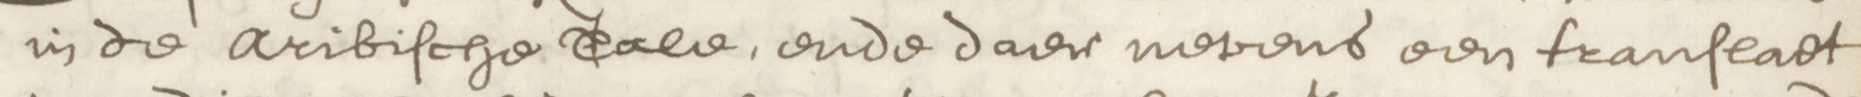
in de Aribische Tale, ende daer nevens een translaet
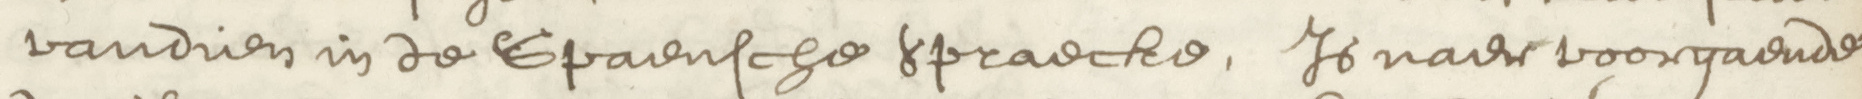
vandien in de Spaensche spraecke, Is naer voorgaende
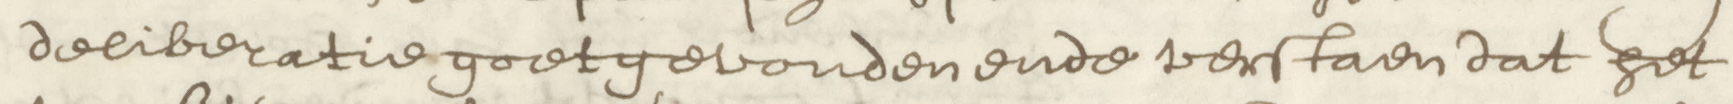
deliberatie goetgevonden ende verstaen dat het
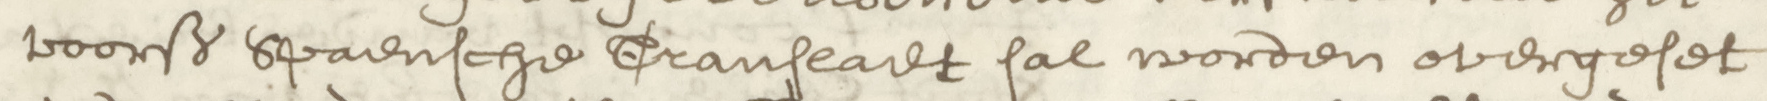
voors Spaensche Translaet sal worden overgeset
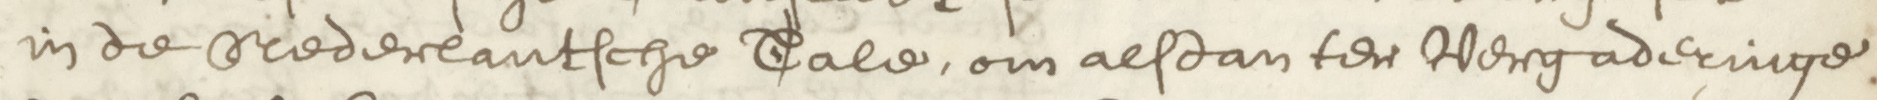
in de Nederlantsche Tale, om alsdan ter Vergaderinge
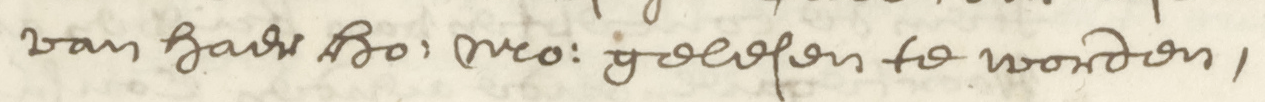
van haer Ho:Mo: gelesen te worden.
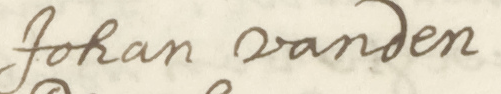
Johan vanden
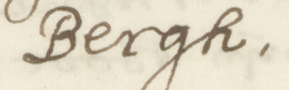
Bergh.
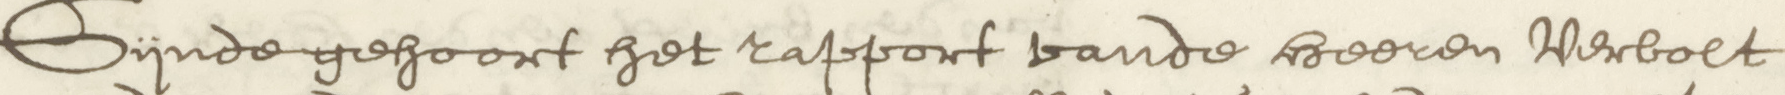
Sijnde gehoort het rapport vande heeren Verbolt
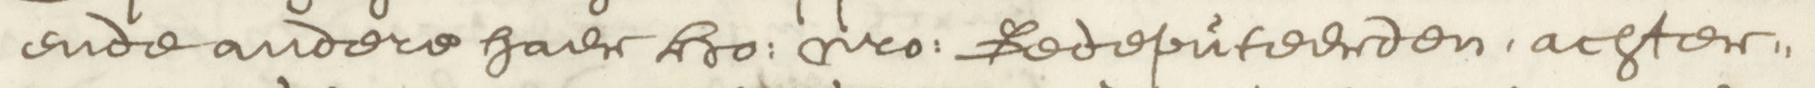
ende andere haer Ho:Mo: Gedeputeerden, achter„
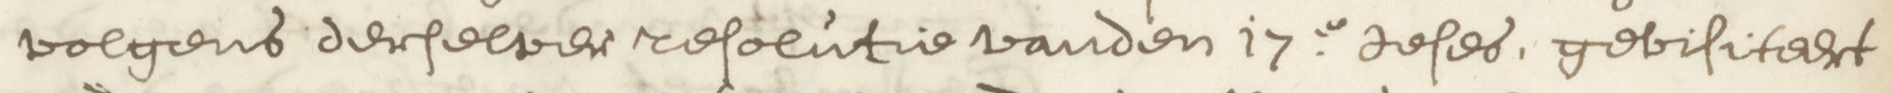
volgens derselver resolutie vanden 17e deses, gevisiteert
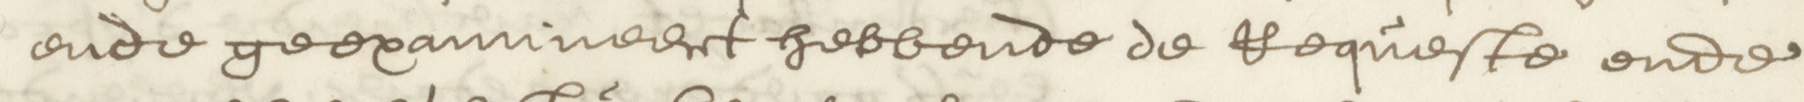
ende geexamineert hebbende de Requeste ende
